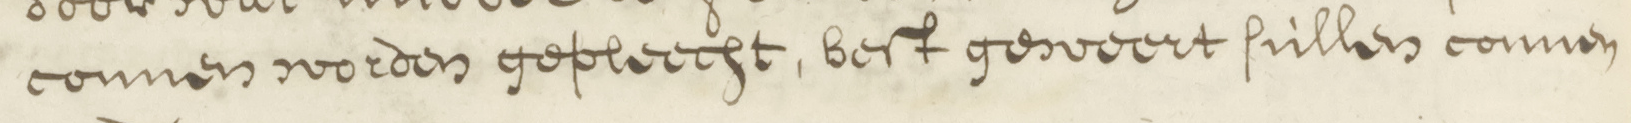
connen worden gepleecht, best geweert sullen connen
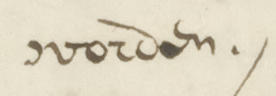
worden.
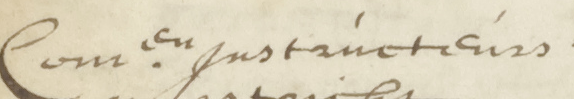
Comen. Instructeurs tot
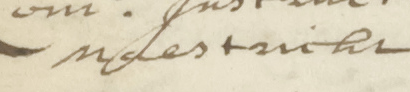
maestricht
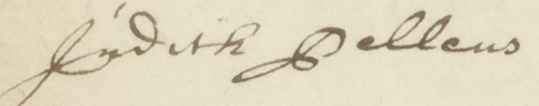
Judith Pellens
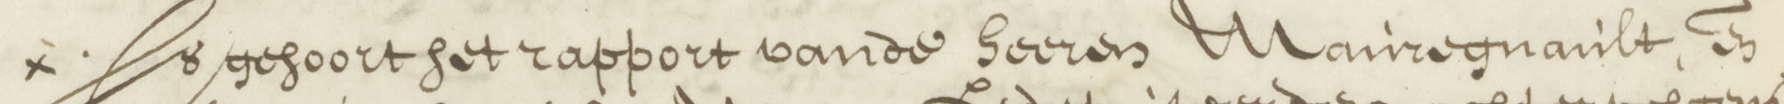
Is gehoort het rapport vande heeren Mauregnault, en
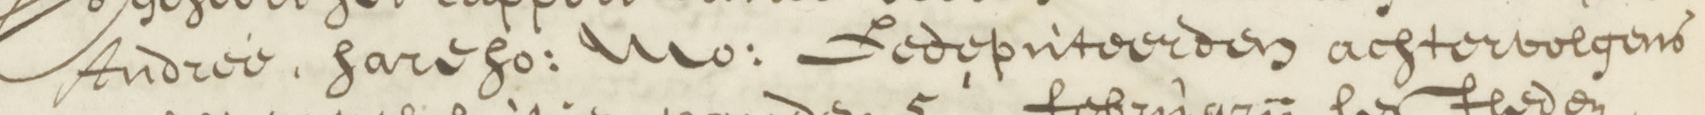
Andree, hare ho:Mo: Gedeputeerden achtervolgens
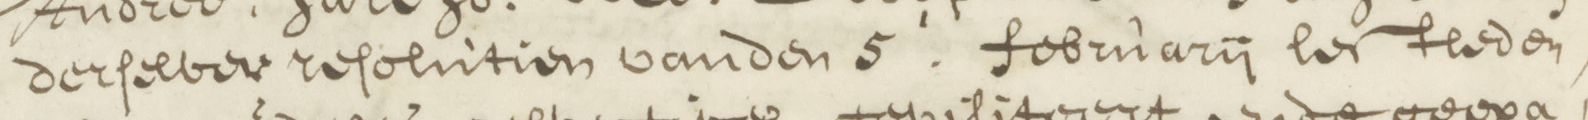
derselver resolutien vanden 5e. februarij lestleden,
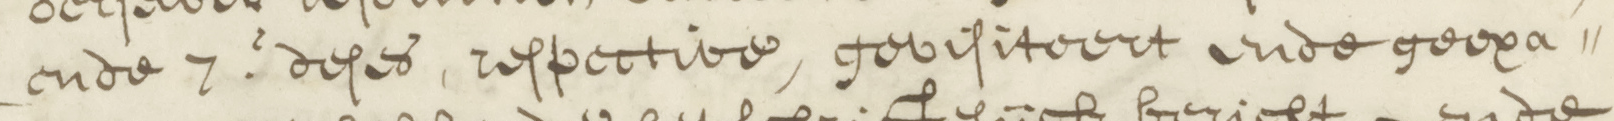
ende 7e. deses, respective, gevisiteert ende geexa„
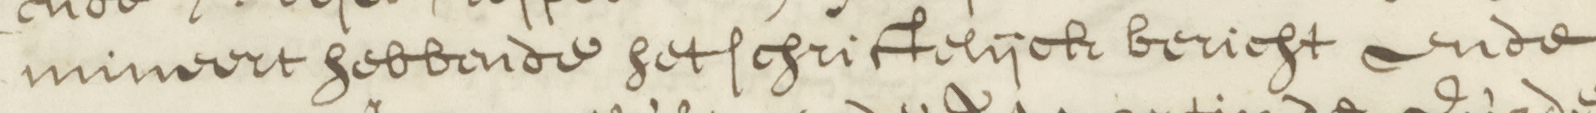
mineert hebbende het schriftelijck bericht ende
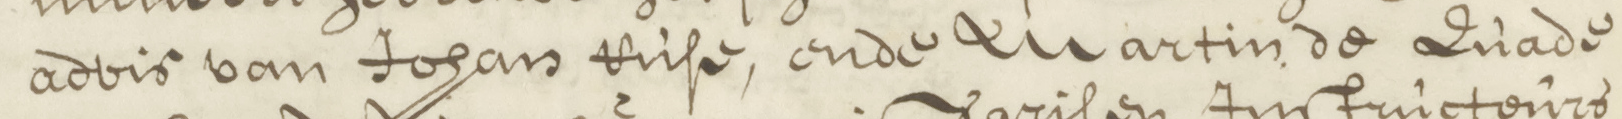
advis van Johan Rise, ende Martin de Quade
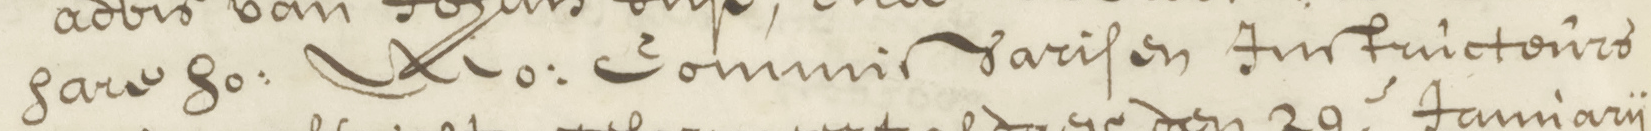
hare ho:Mo: Commissarisen Instructeurs
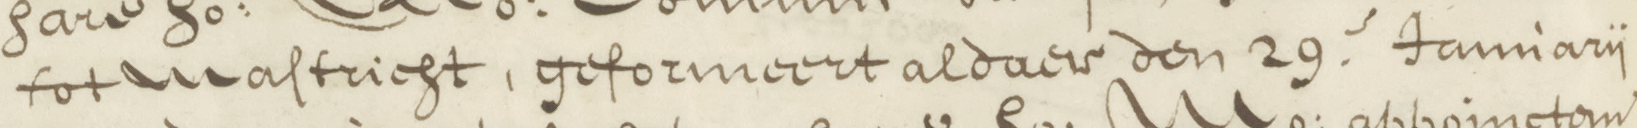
tot Mastricht, geformeert aldaer den 29e. Januarij
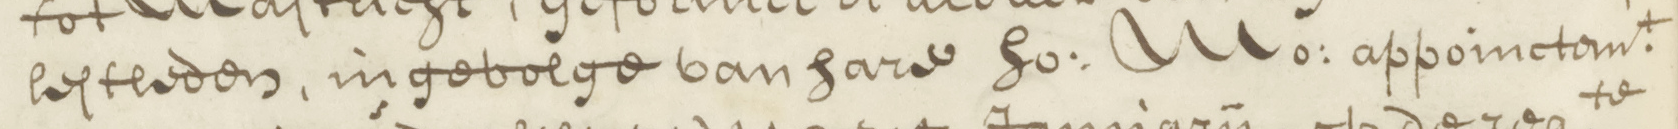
lestleden, ingevolge van hare ho:Mo: appoinctemt.
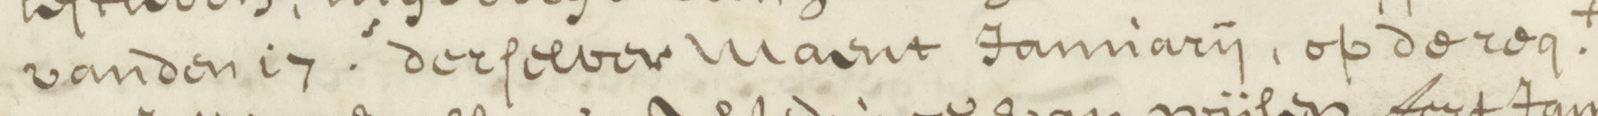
vanden 17e. derselver Maent Januarij, op de reqte.
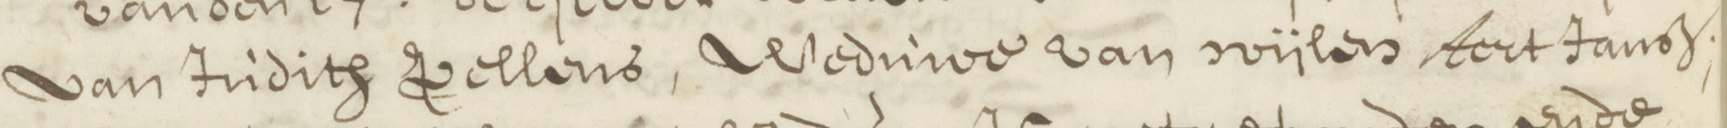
van Judith Pellens, Weduwe van wijlen Aert Jansz;
